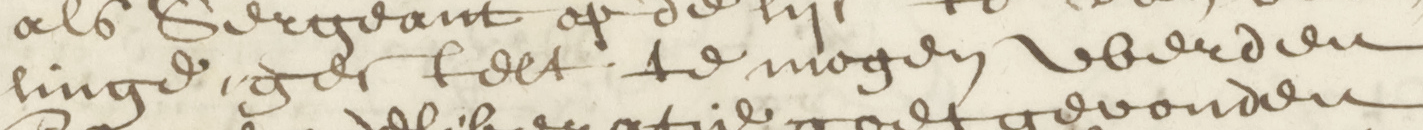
linge, gestelt te mogen werden:
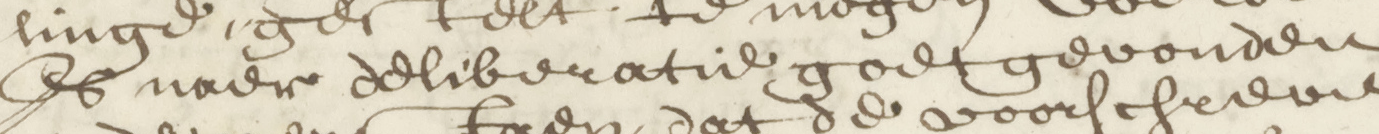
Is naer deliberatie goetgevonden
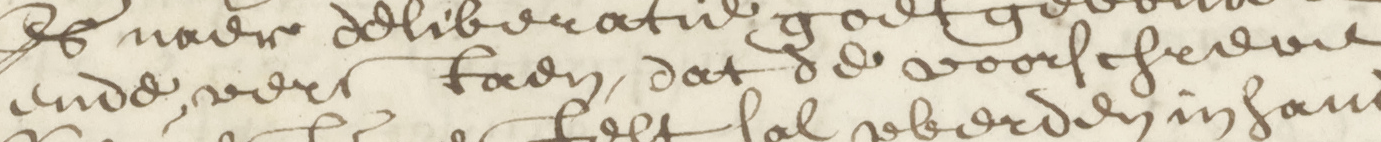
ende verstaen, dat de voorschreve
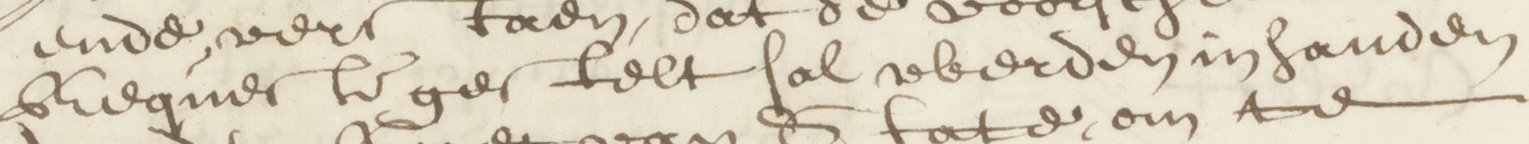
Requeste gestelt sal werden in handen
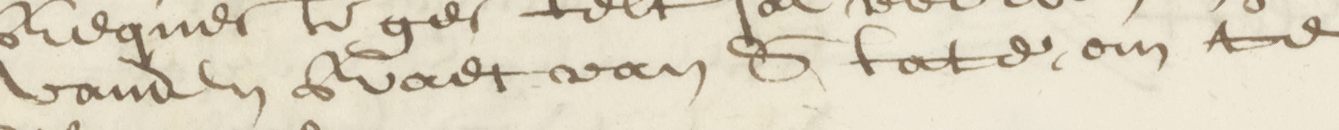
vanden Raet van State, om te
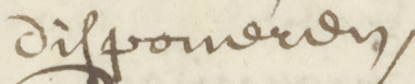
disponeren.
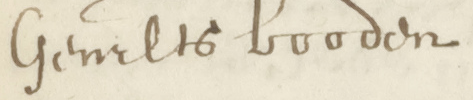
Genrlts booden
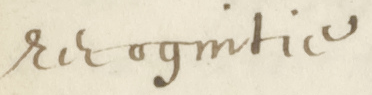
recognitie
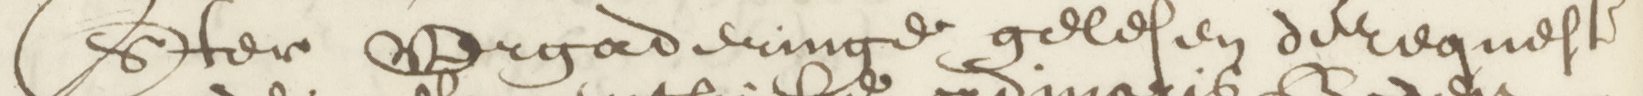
Is ter Vergaderinge gelesen de requeste
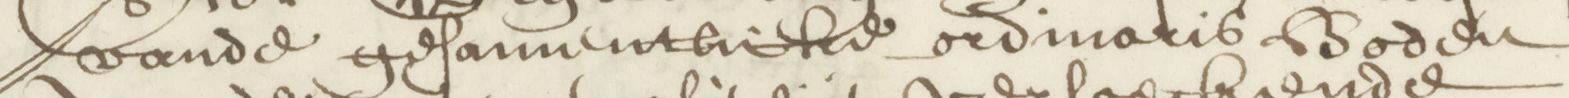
vande gesamentlicke ordinaris Boden
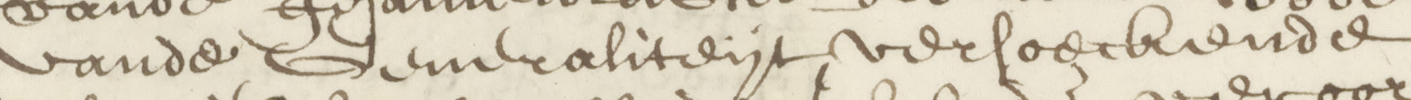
vande Generaliteijt versoeckende
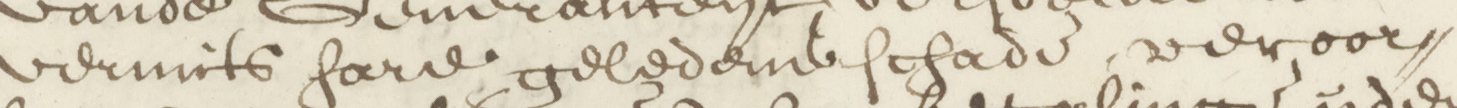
vermits hare geledene schade, veroor„
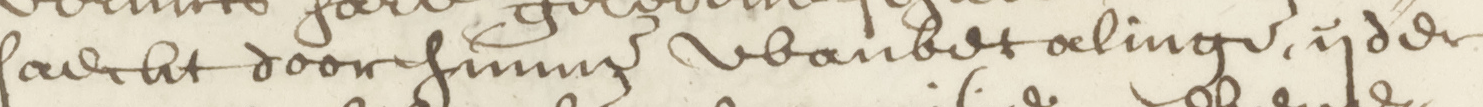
saeckt door hunne wanbetalinge, ijder
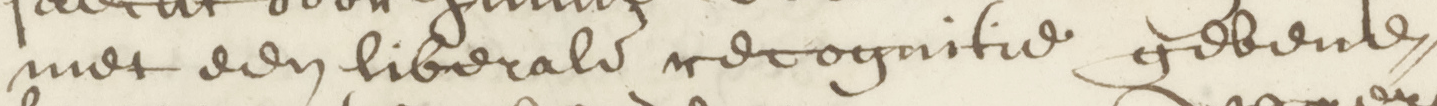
met een liberale recognitie gebene„
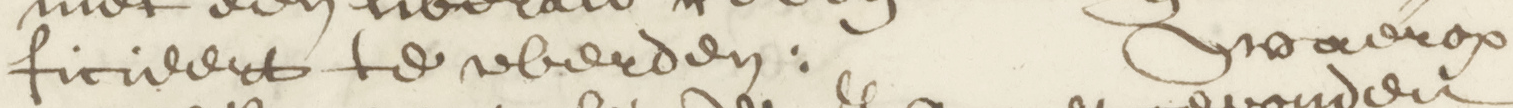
ficieert te werden: Waerop
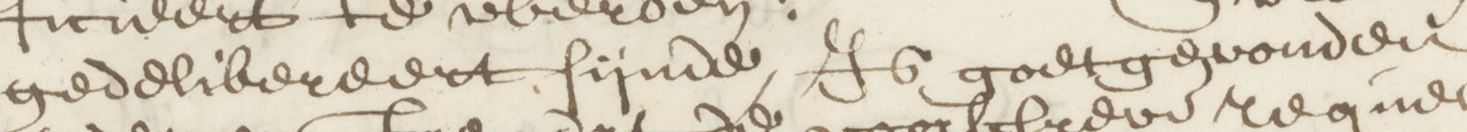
gedelibereert sijnde, Is goetgevonden
